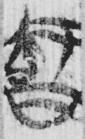智（知）
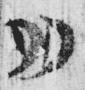多
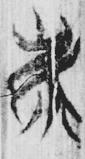廌
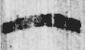一
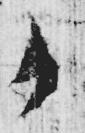人
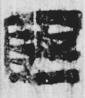爲
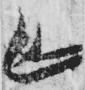亡（無）
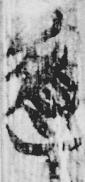道
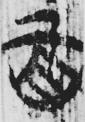百
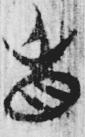眚（姓）
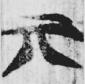亓（其）
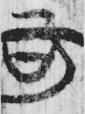可（何）
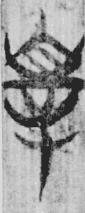辠（罪）
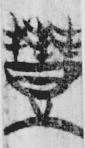豐
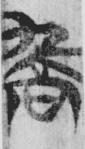喬（鎬）
